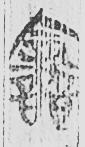{宀言言言}
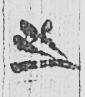之
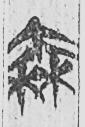秦
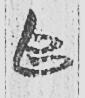𠂤
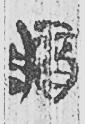𨟻
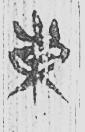東
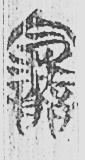{宀言言言}
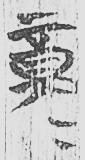奠=
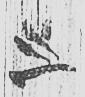之
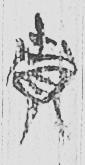賈
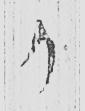人
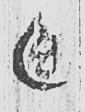弦
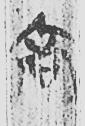高
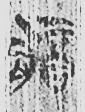𨟻
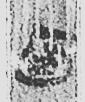西
